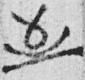至
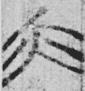亦
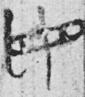母（毋）
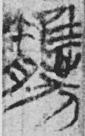○（繘）
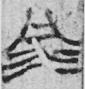汬
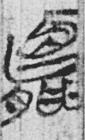○（羸）
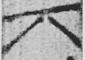亓（其）
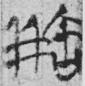缾（瓶）
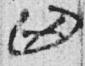凶
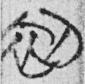初
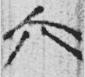六
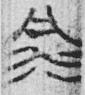汬
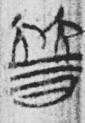暜
